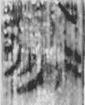鄝
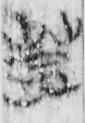莫
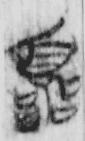囂
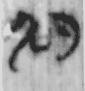卲
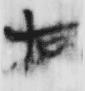左
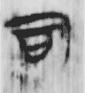司
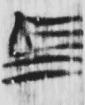馬
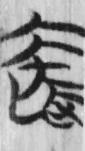殹
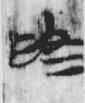爲
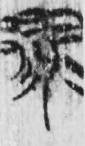鄝
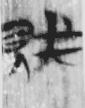貸
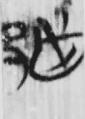○（越）
